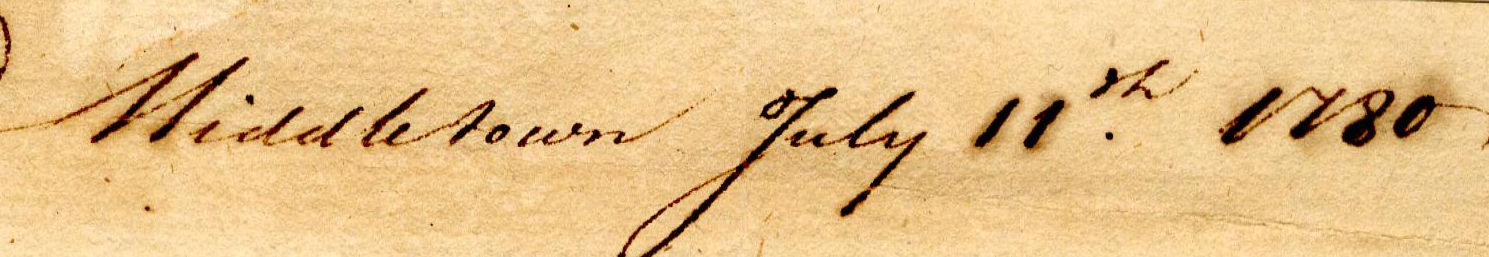Middletown July 11^th. 1780
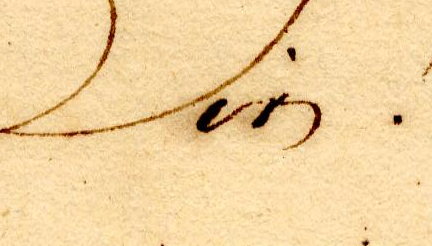Sir
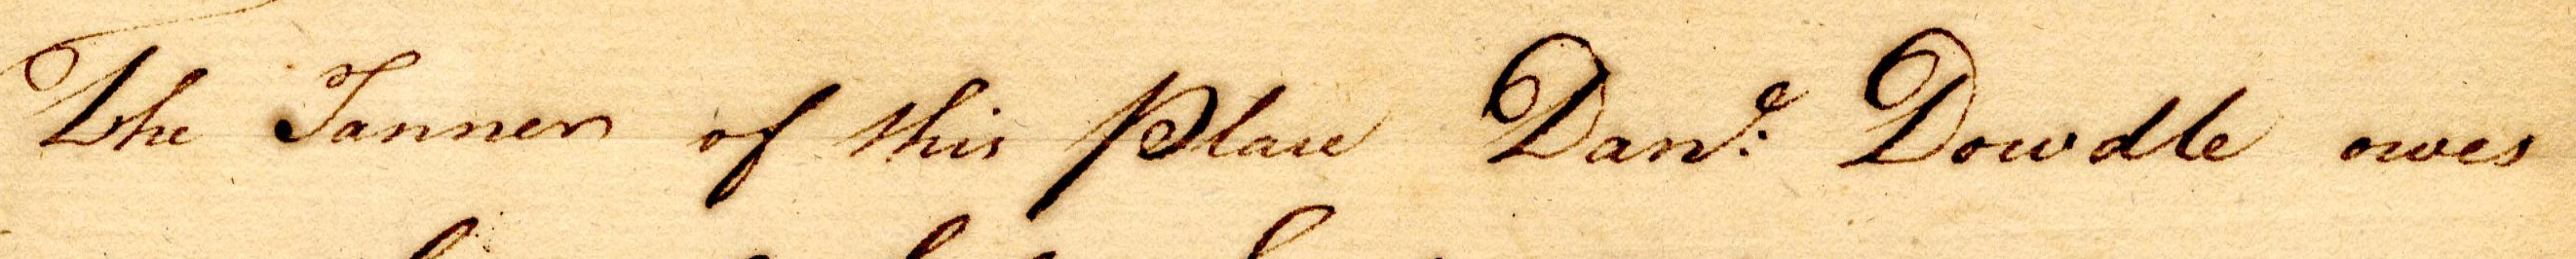The Tanner of this Place Dan^l. Dowdle owes
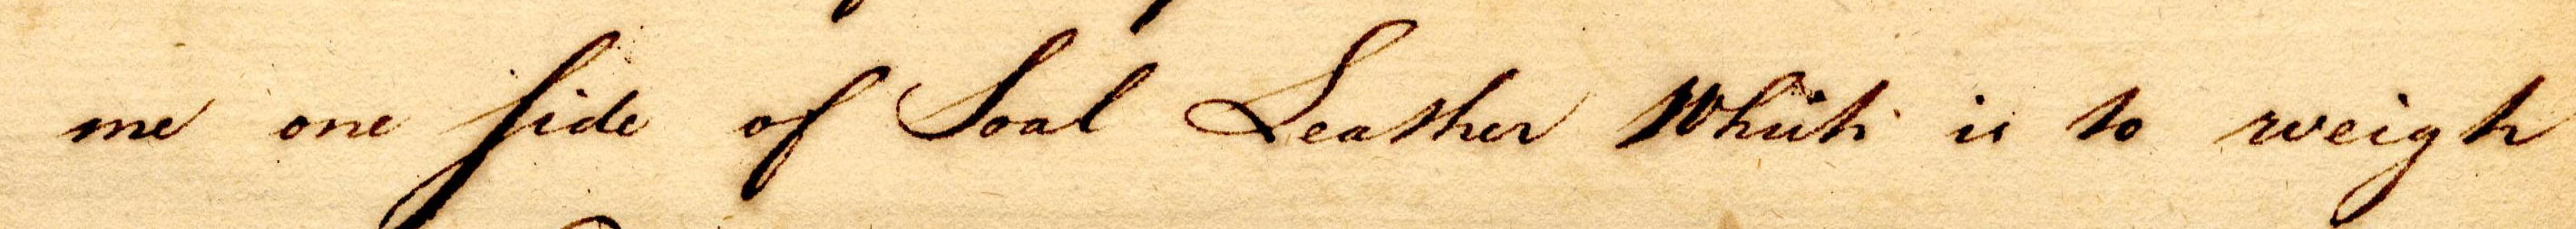me one side of Soal Leather Which is to weigh
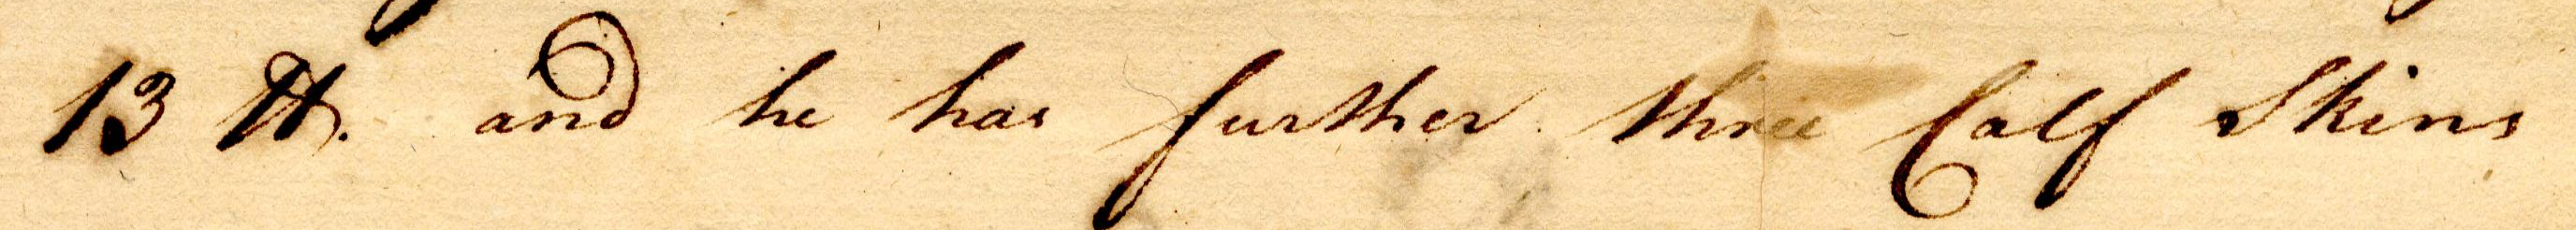13 lb. and he has further three Calf Skins
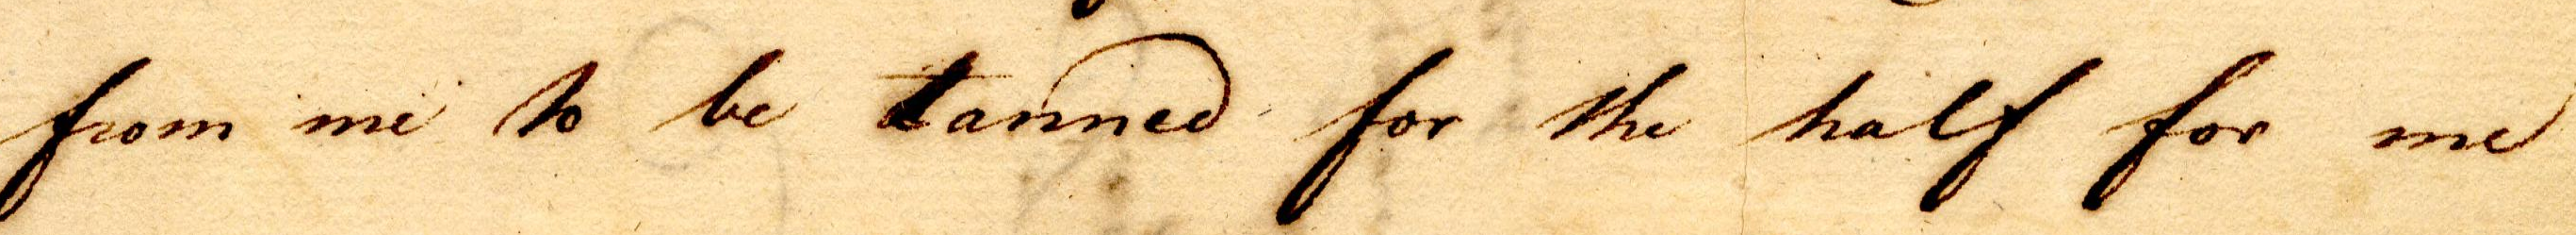from me to be tanned for the half for me
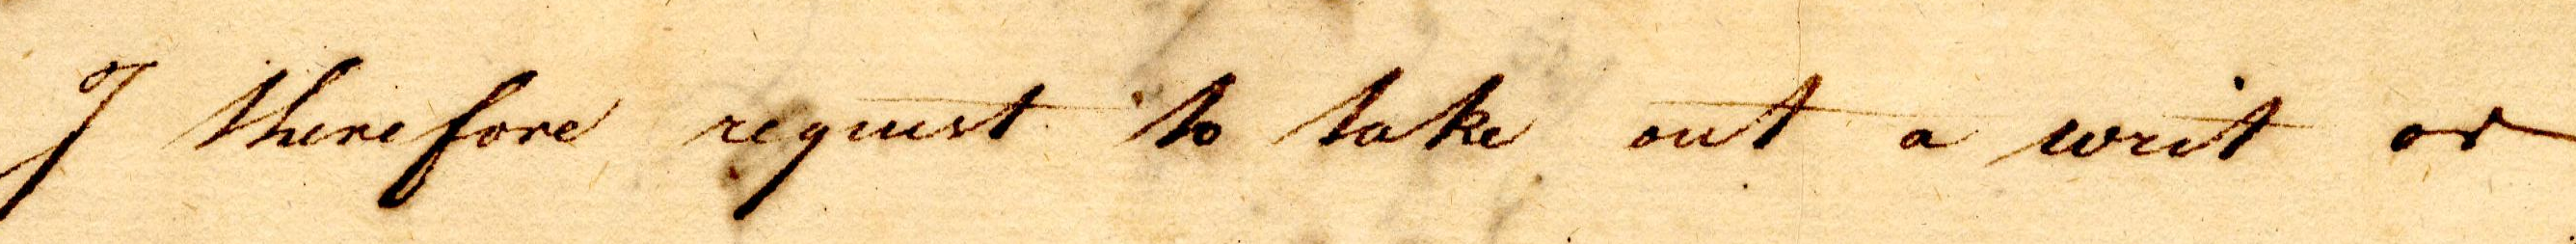I therefore request to take out a writ or
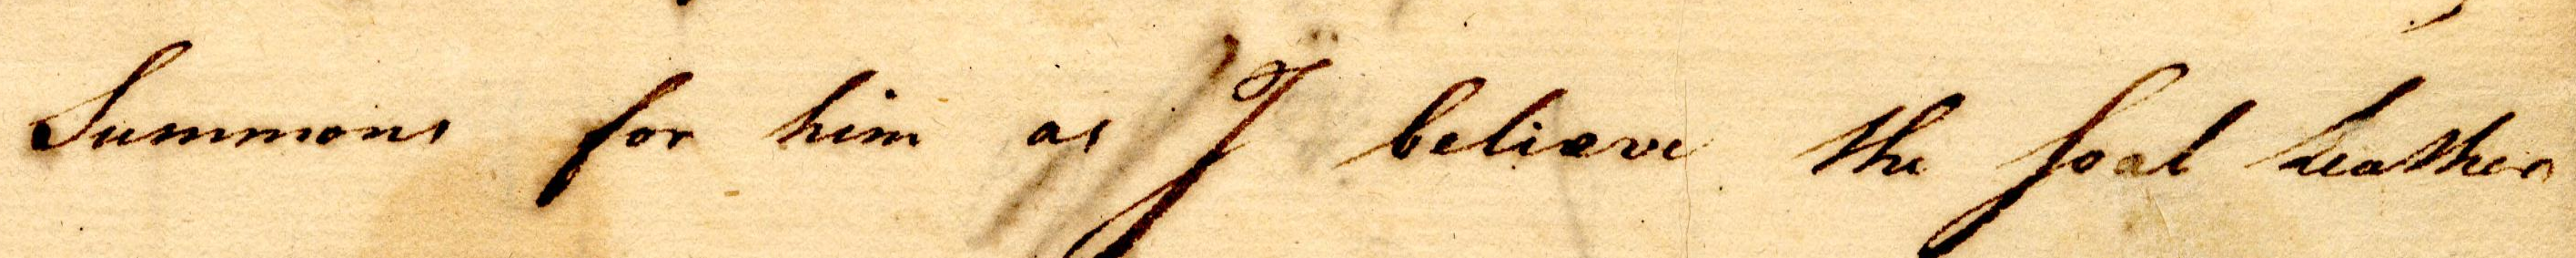Summons for him as I believe the soal leather
